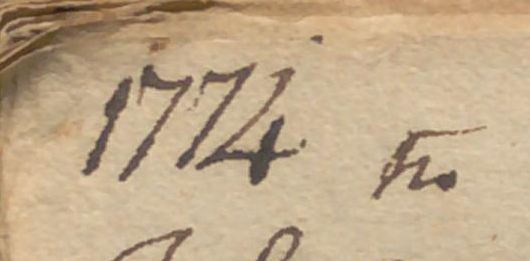1774
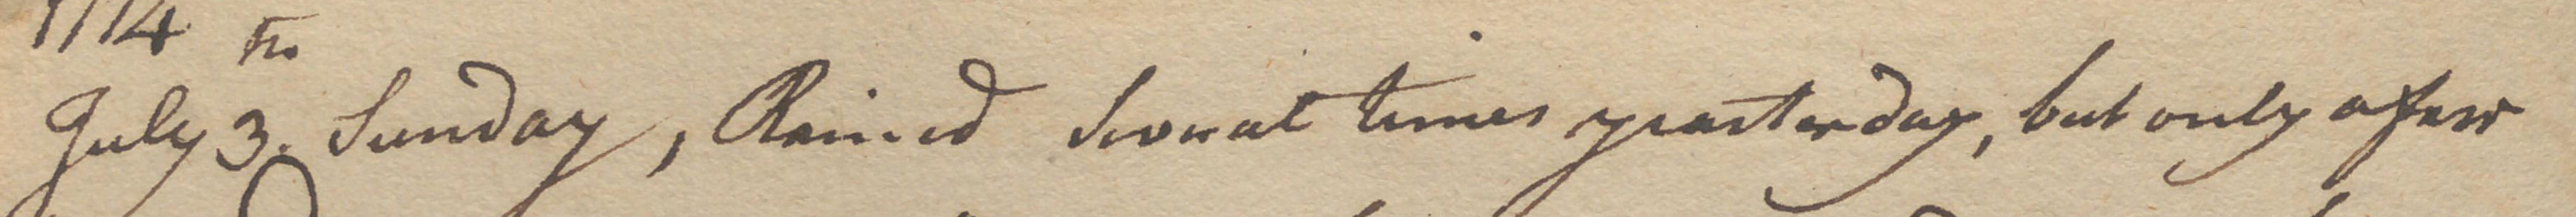July 3^th. Sunday, Rained several times yeasterday, but only a few
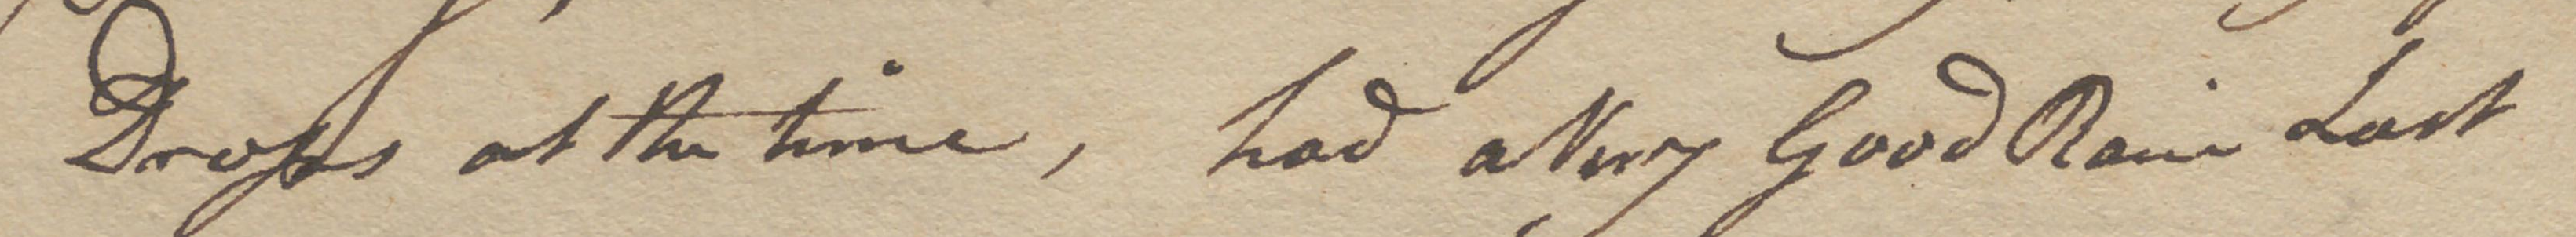Drops at the time, had a Very Good Rain Last
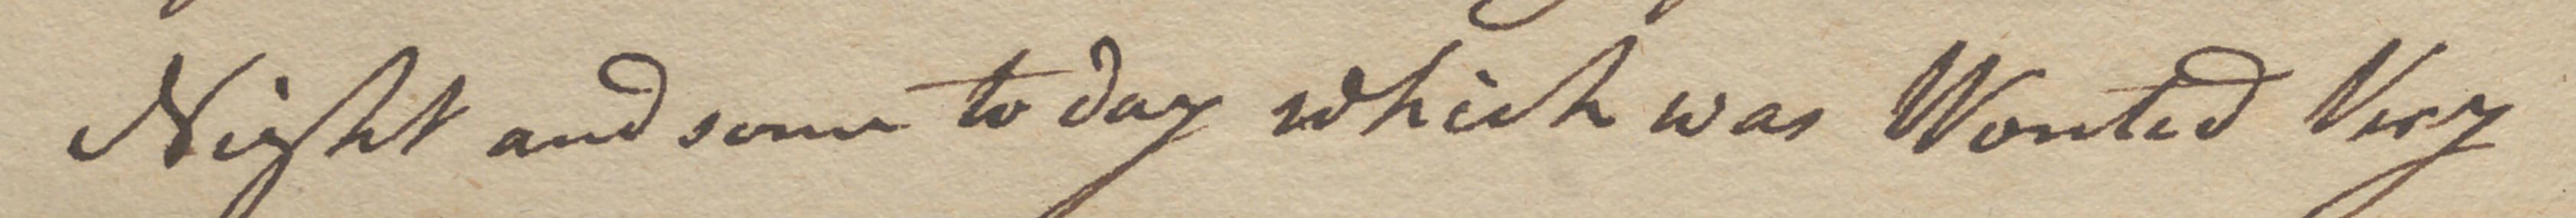Night and some to day which was Wanted Veny
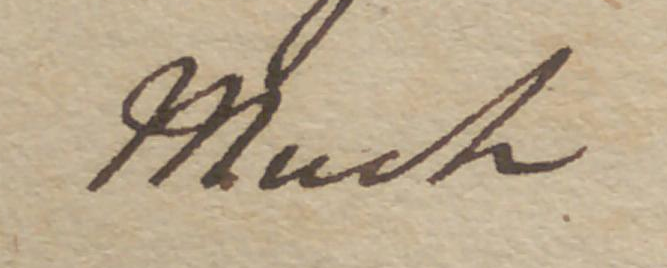Much
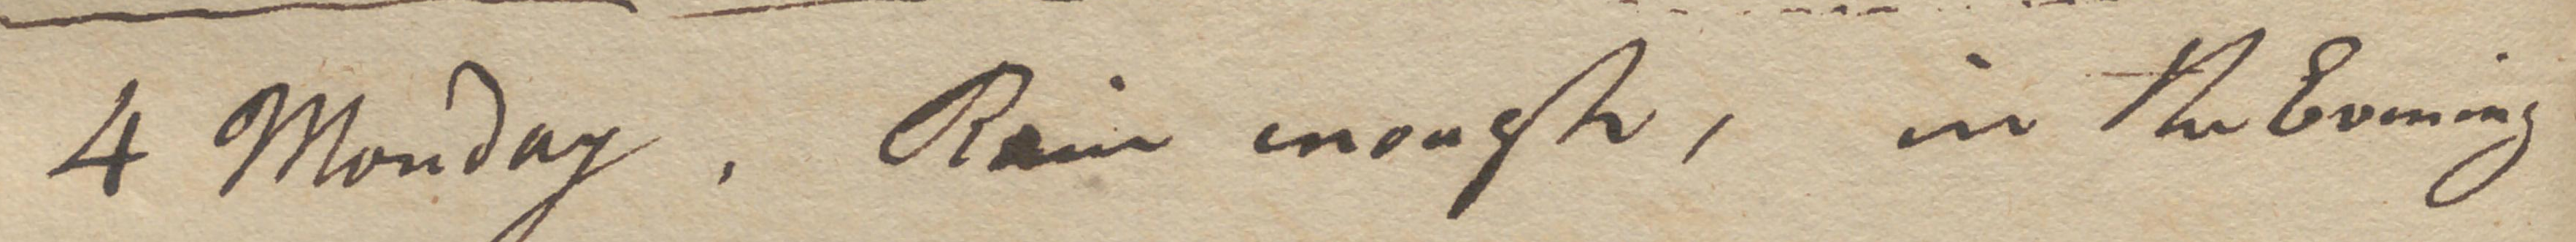4 Monday. Rain enough, in the Evening
